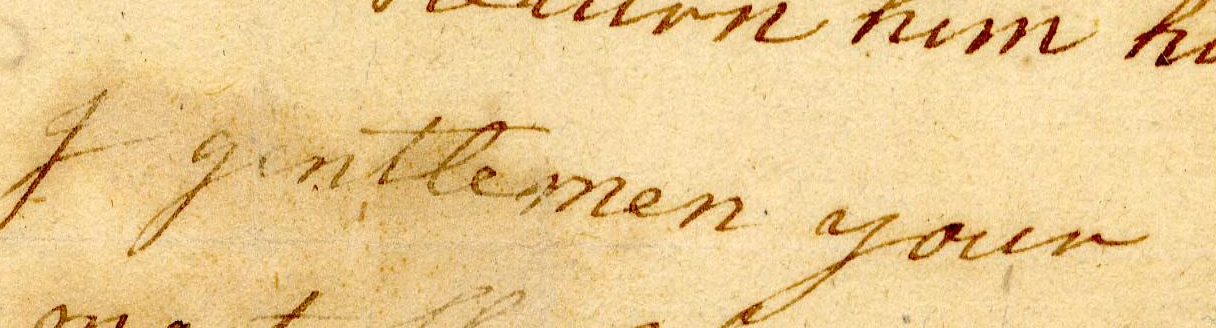I gentlemen your
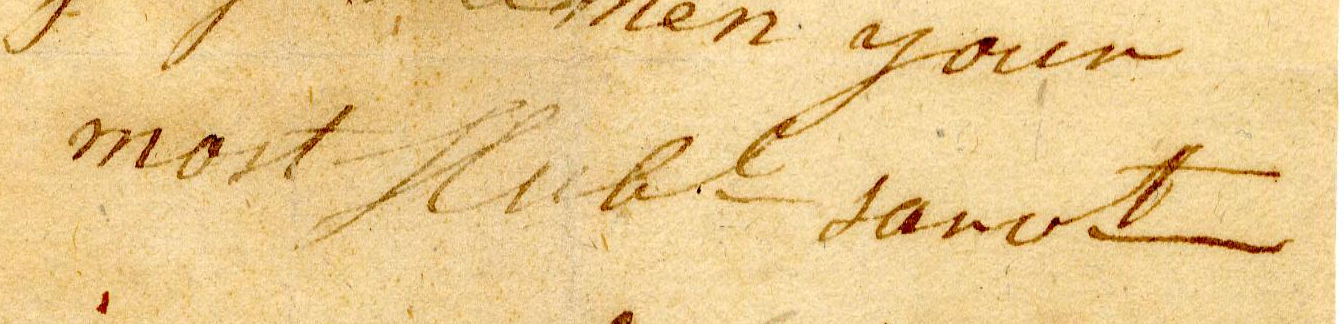most Hub^l sarv^t
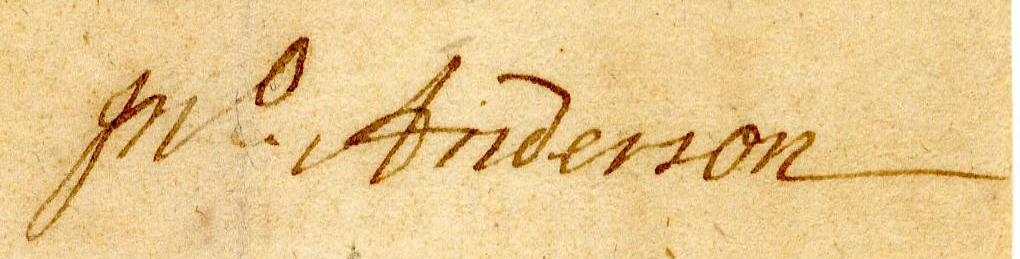M^r Anderson
